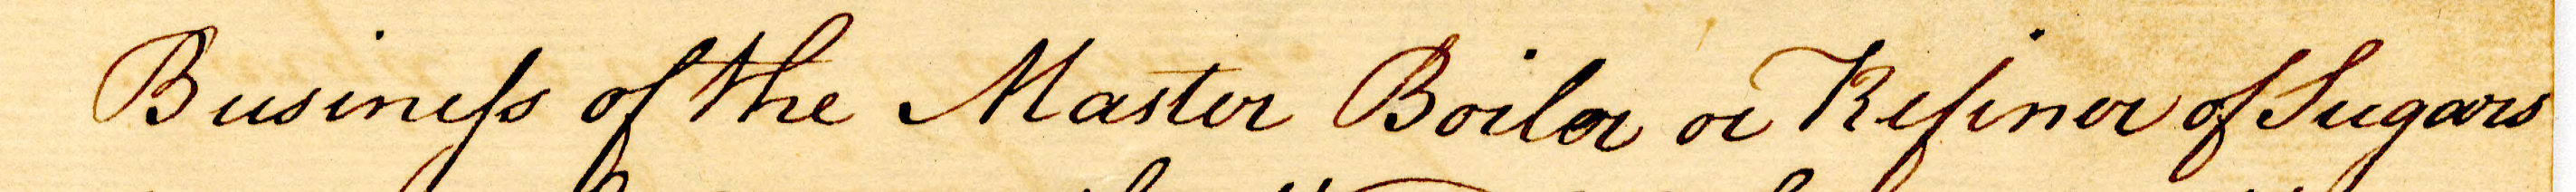Business of the Master Boiler or Refiner of Sugars
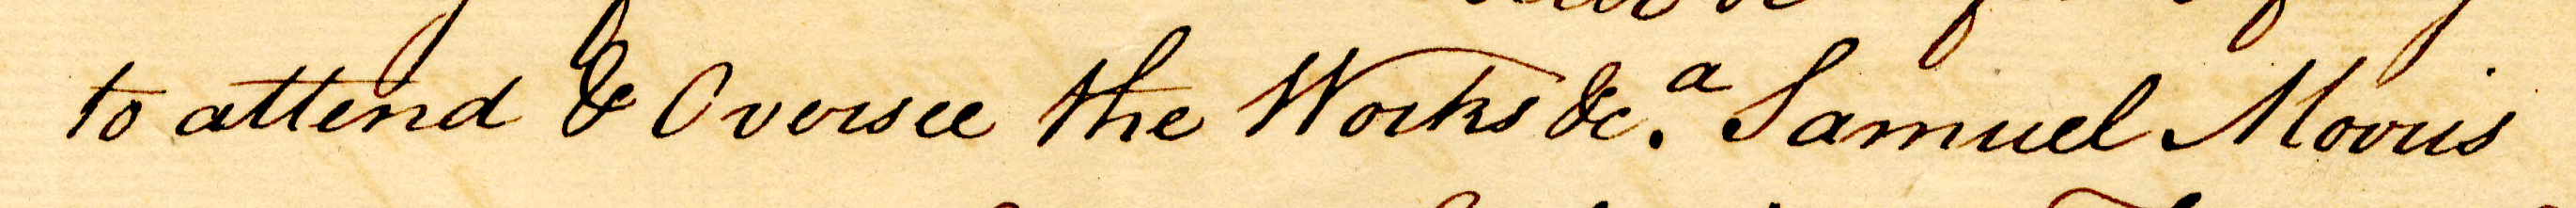to attend & oversee the Works &c^a. Samuel Morris
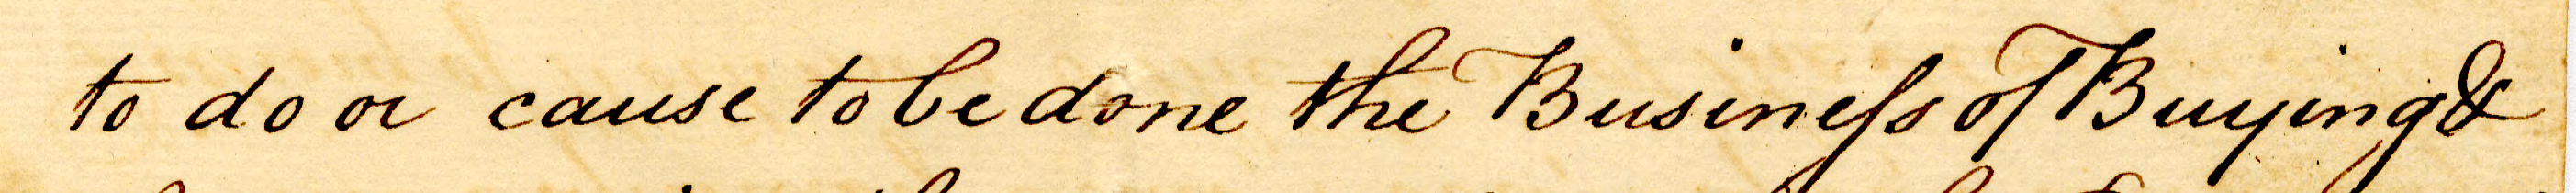to do or cause to be done the Business of Buying &
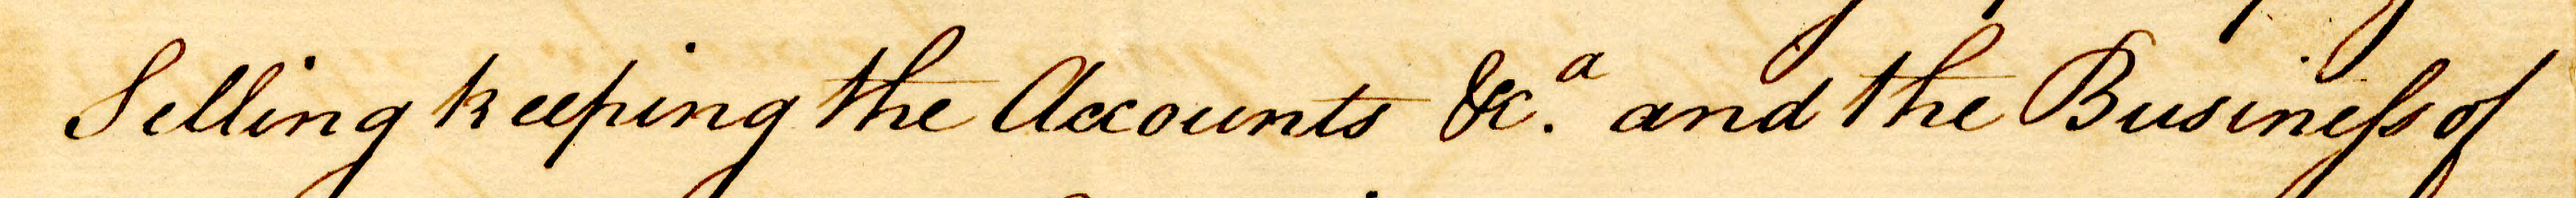Selling keeping the accounts &c^a. and the Business of
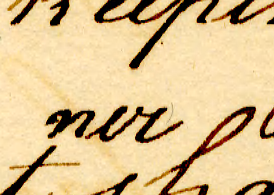ner
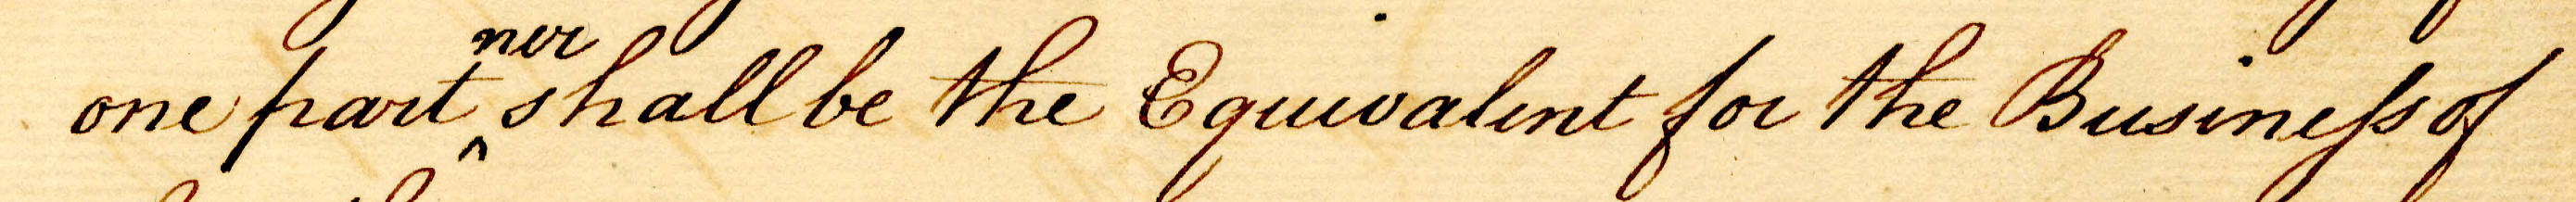one part^ shall be the Equivalent for the Business of
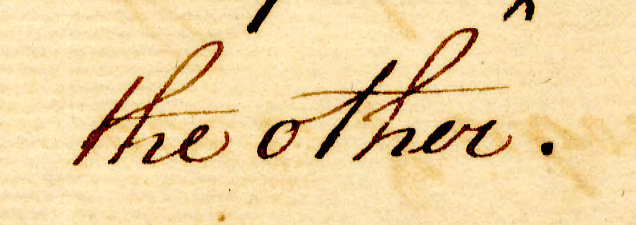the other.
